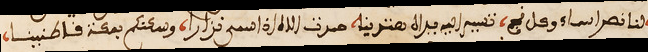لنا نصر اسماء كل نجم تسير اليه يداه هترينا حمدت الله اذا سمى نزارا وسكنكم بمكة قاطنينا
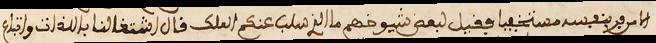الا من فر بنفسه مستخفيا فقيل لبعض شيوخهم ما الذي سلب عنكم الملك قال اشتغالنا باللذات واتباع
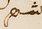شهر
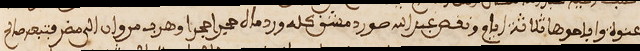عنوة واباحوها ثلاثة ايام ونقص عبد الله صور دمشق كله وردماه حجرا حجرا وهرب مروان الى مصر فتبعه صالح
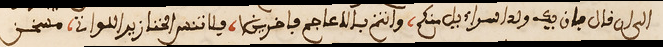الى ان قال فان بك ولد اسواءيل منكم وانتم بالاعاجم فاخرينا فلا تنس الخنازير اللواتى مسخن
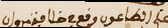على الطاعون وقع ف خلافة مروان
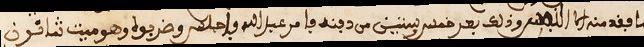ما فقد منه الا النفس وذلك بعد خمس سنين من دفنه فامر عبد الله واجلس وضربوه وهو ميت ثمانون
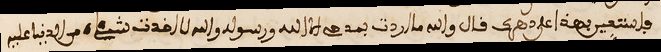فاستعين فهذا على دهرك قال والله ما اردت بمدحى الا الله ورسوله والله لا اخدت شيىا من الدنيا عليه
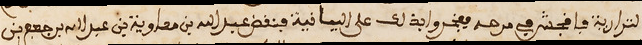لنزارية فنفحش في مدحه ففخروا بذلك على اليمانية فنقض عبد الله بن معاوية بن عبد الله بن جعفر بن
